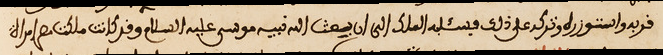قربه واستوزره وتركه على ذلك فسلبه الملك الى ان يبعث الله نبيه موسى عليه السلام وقد كانت ملكت مصر امراة
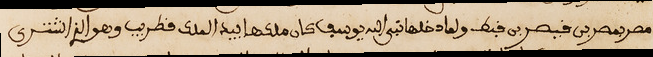مصر بمصر بن قيصر بن قبط ولما دخلها نبى الله يوسف كان ملكها بيد الملك قطريب وهو الذي اشترى
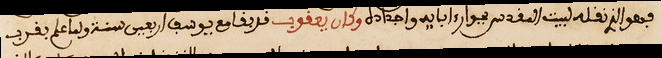فهو الذي نقله لبيت المقدس بجوار ءابايه واجداده وكان يعقوب قد بقا مع يوسف اربعين سنة ولما علم بقرب
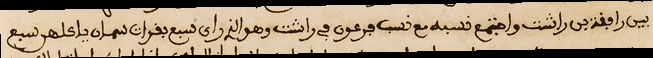بين رافقة بن راشت اجتمع نسبه مع نسب فرعون في راشت وهو الذي راى سبع بقرات سمان ياكلهن سبع
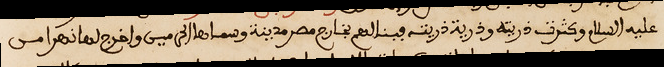عليه السلام وكثرت ذريته وذرية ذريته فبنالهم نجارج مصر مدينة وسماها الحرمين واخرج لها نهرامن
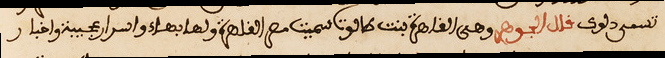تسمى دلوك قال الجوهرى وهى القاهرة بنت طالوت سميت مصر القاهرة ولها بهاء واسرار عجيبة واخبار
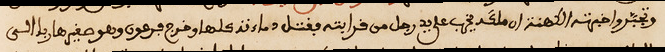وتجبّر واخبرته الكهنة ان ملكه يخرب على يد رجل من قرابته فقتل دماءته كلها وخرج فرعون وهو صغيرها ربا الى
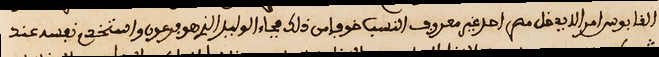القابوس امر الا يد قد مصر احد غير معروف النسب خوفا من ذلك فجاء الوليد الذي هو فرعون واستخدم نفسه عند
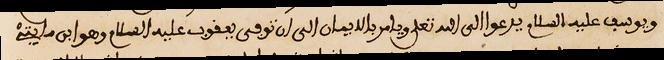ويوسف عليه السلام يدعوا الى الله تعلى ويامر بالايمان الى ان توفى يعقوب عليه السلام وهو ابن مايتي
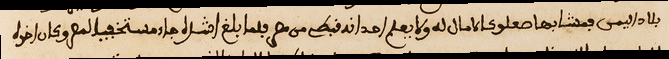بلاد اليمن فمشا بها صعلوكا لا مال له له ولا يعلم احد انه قبطى من مصر فلما بلغ اشده جاء مستخفيا لمصر وكان اخوه
